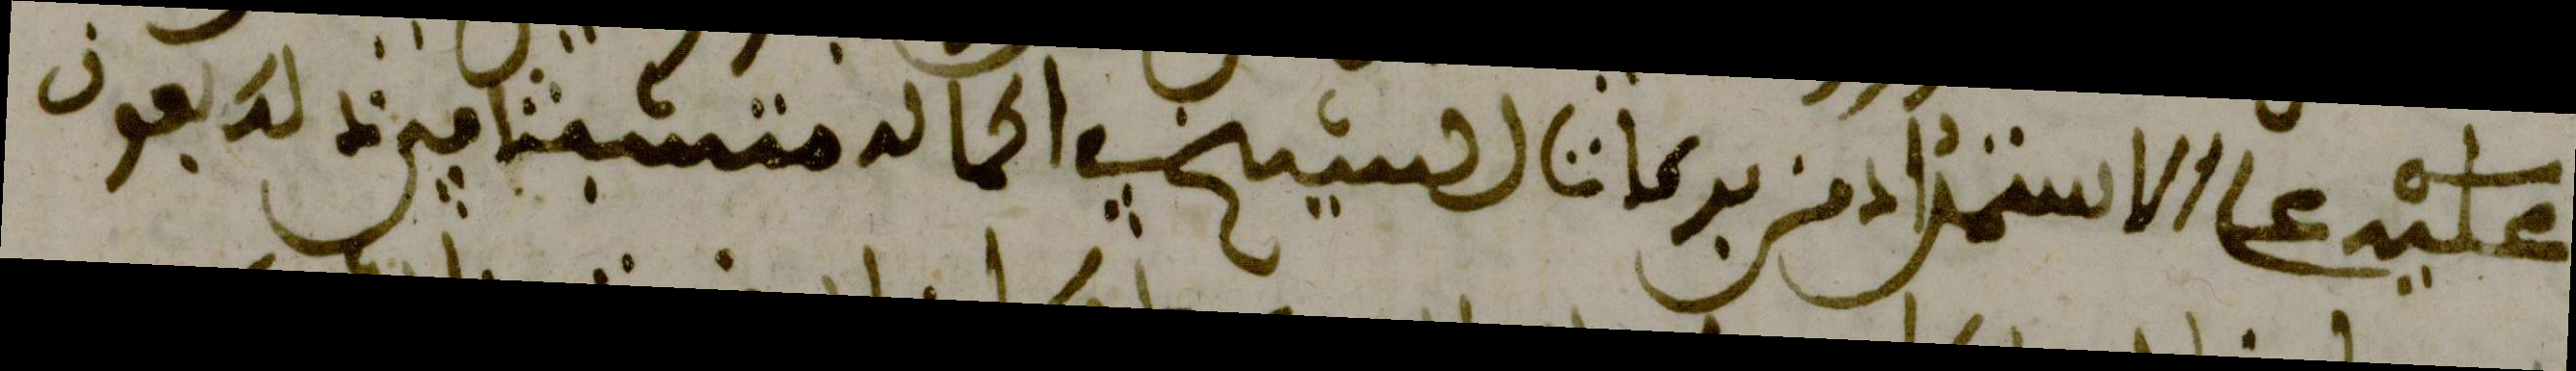عليْه على الاستمداد من بركات الشيخ في اكماله متشبثا في ذلك يعون
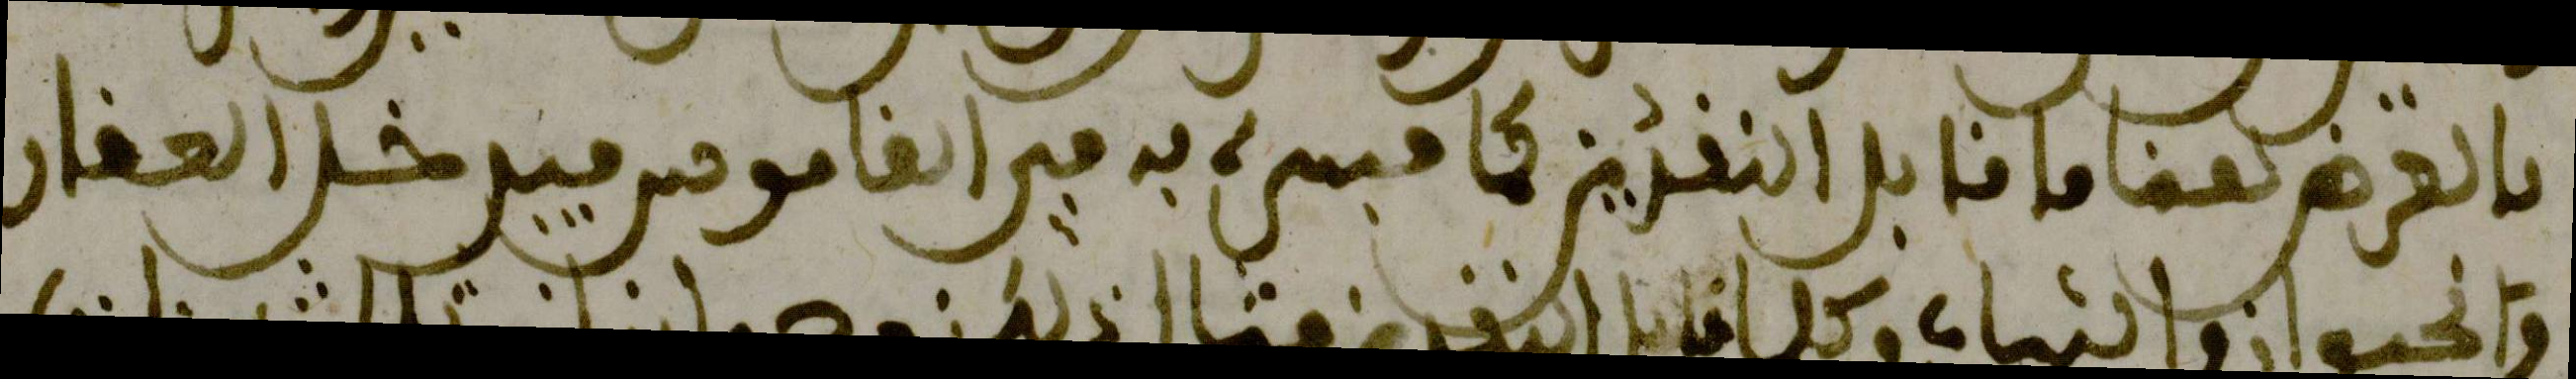بالعرض هنا ما قابل النقدين كما قسره به في القاموس فيدخل العقار
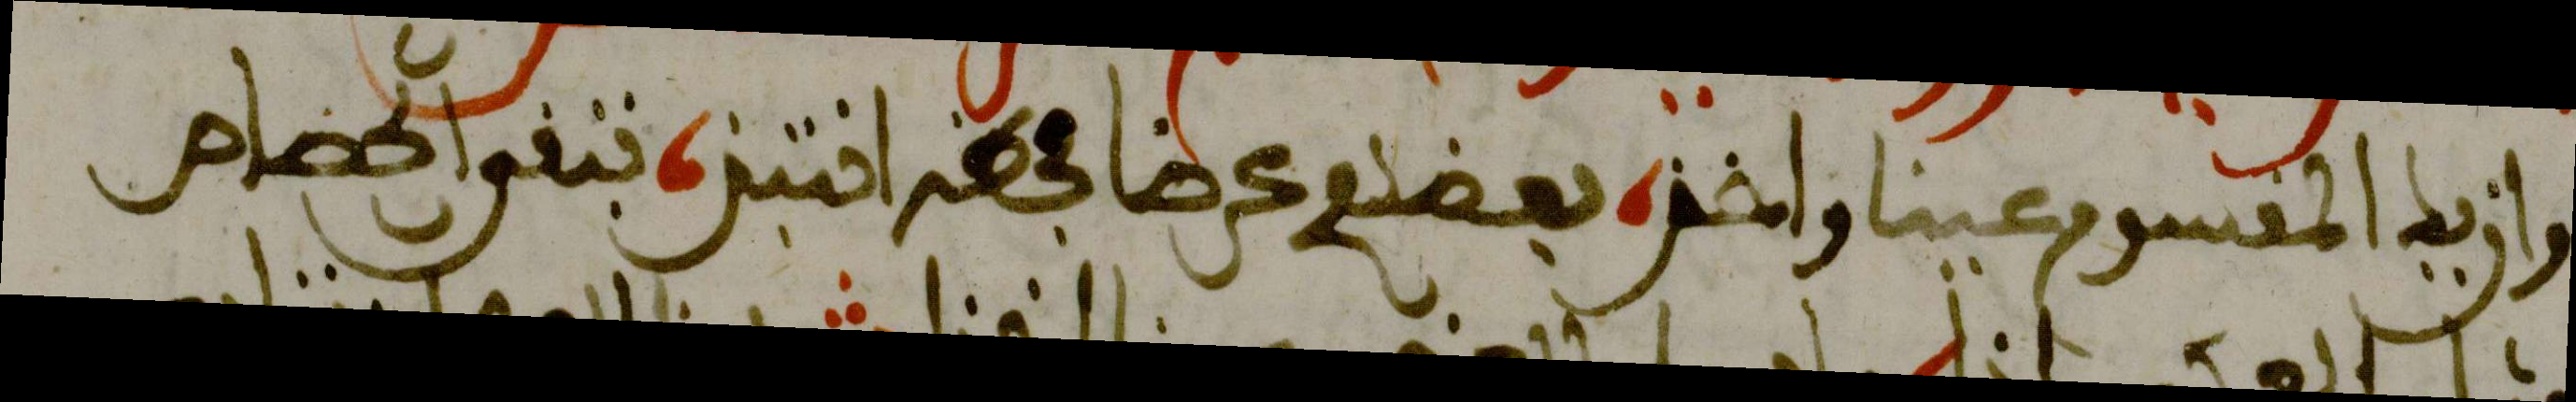وان يك لمقسوم عينه واخذ بعضهم عرضا فحظه انتبذ تبقى الحصاص
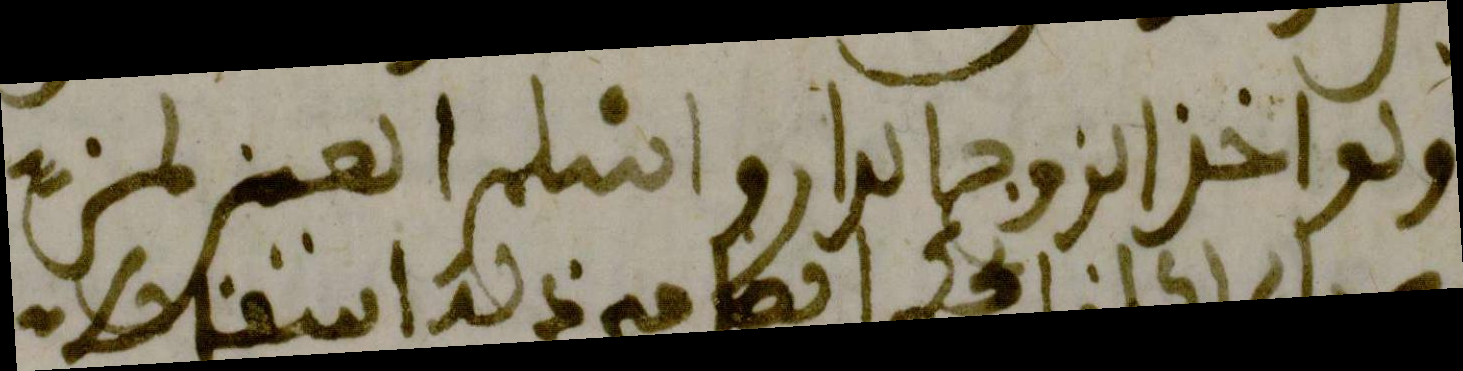وهو اخذ الزوج الدار واسْلم العين لمن
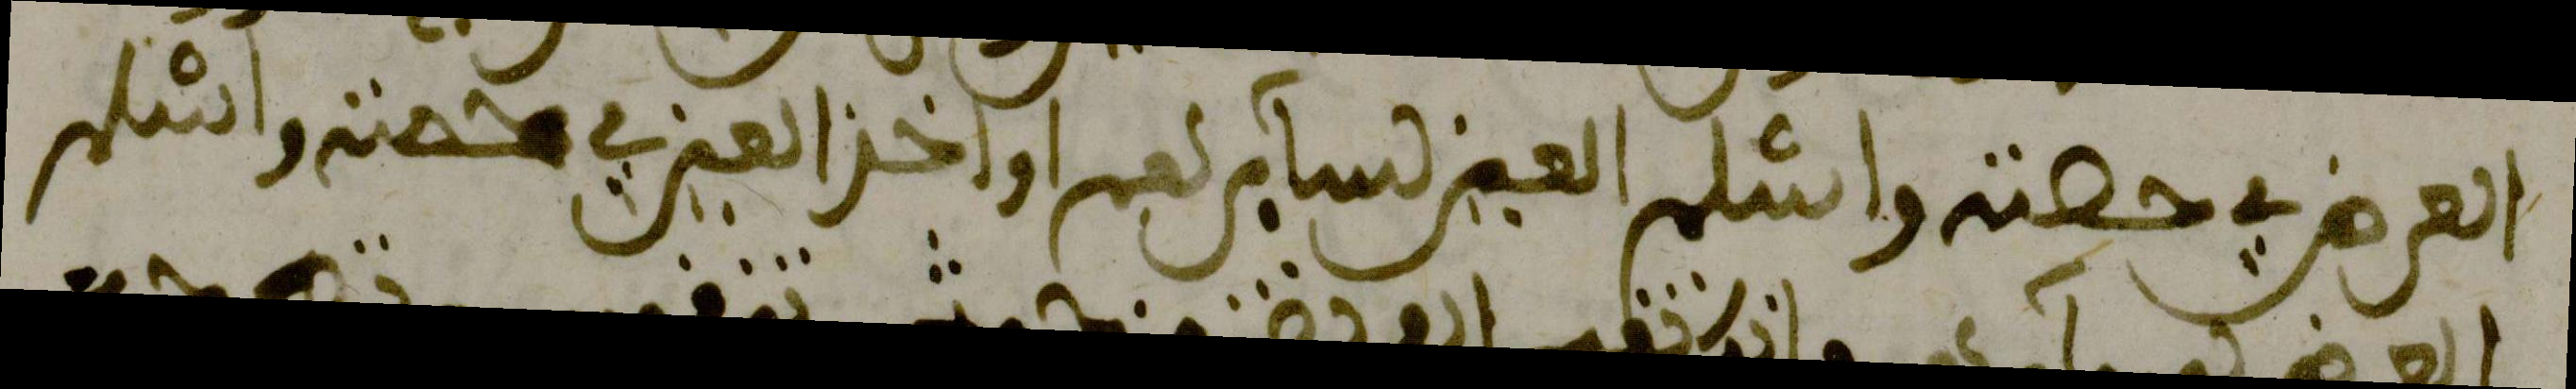العرض في حصته واسْلم العين لسائرهم واخذ العين في حصته واسْلم
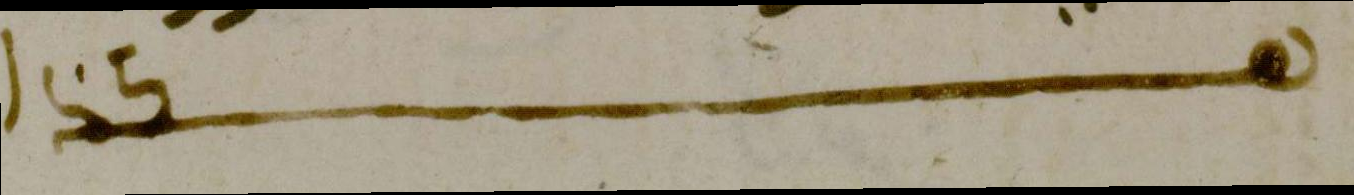هكذا
